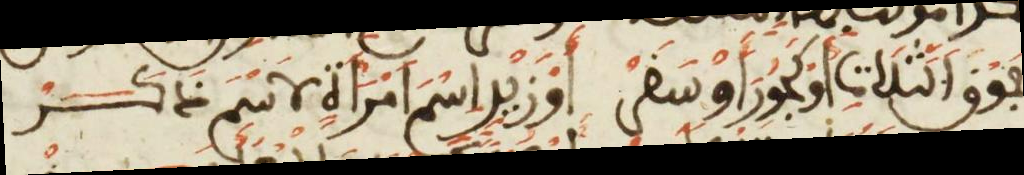فوق الثلاث او كجور او سغر او زيد اسم امراة لاسم ذكر
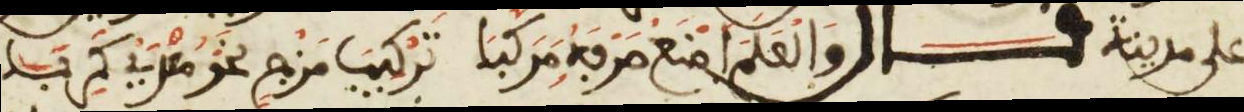على مدينة قال و العلم امنع صرفه مركبا تركيب مزج نحو معدي كربا
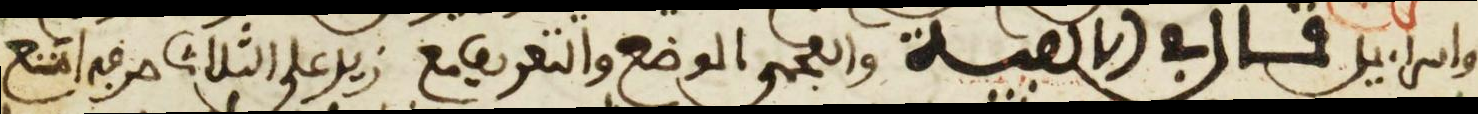واسراءيل قال في الالفية والعجمى الموضع و التعريف مع زيد على الثلاث صرفه ام#ع
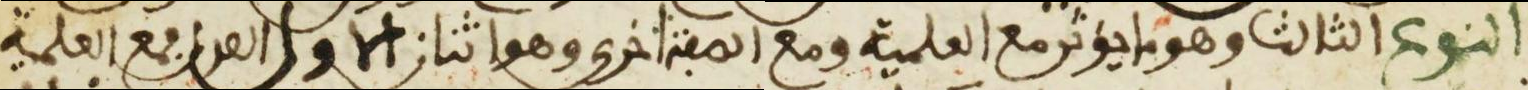النوع الثالث و هو ما يوثر مع العلمية و مع الصفة أخرى و هو اثنان الأول العدل فمع العلمية
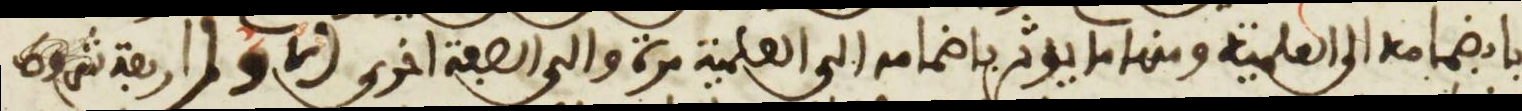باءضمامه الى العلمية و ومنها ما يوثر باضمامه الى العلمية مرة و الى الصفة أخرى الأول أربعة #
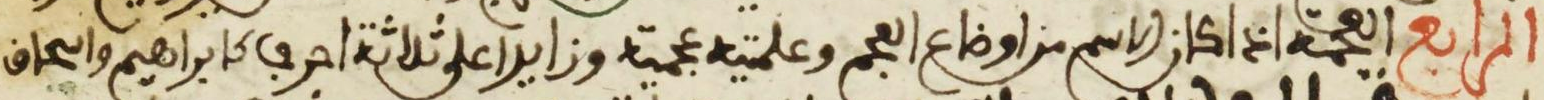الرابع العجمة اذا كان الاسم من اوضاع العجم و علميته عجميته و زايدا على ثلاثة احرف كابراهيم و اسحاق
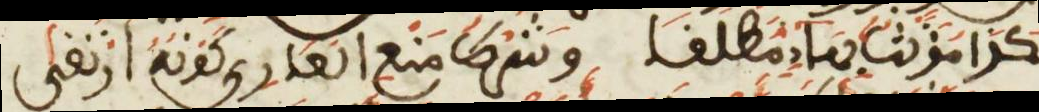كذا مؤنث بماء مطلقا وشرط منع العارى كونه ارتقى
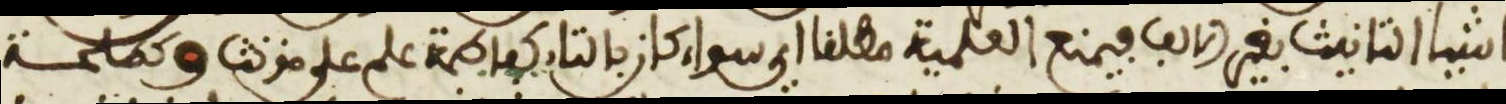اشيا الثانيث بغيرالالف فيمنع العلمية مطلقا أي سواء كان بالتاء كفاطمة علم على مؤنث و كطاحة
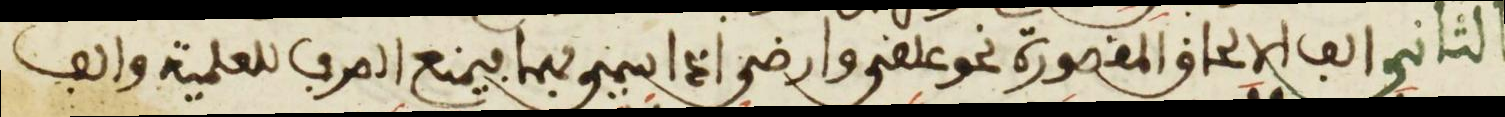الثاني الف الالحاق المقصورة نحو علقى و ارضى اذا سمي بما فيمنع الصرف للعلمية و الف
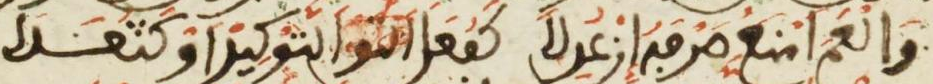و العم امنع صرفه ان عدلا كفعل التوكيد او كثعلا
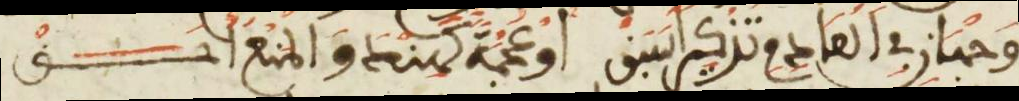وجهان في العادم تذكير ا سبق او عجمة كهند و المنع احق
